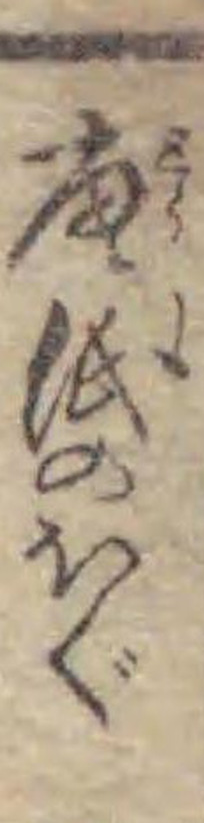唐紙のほぐ
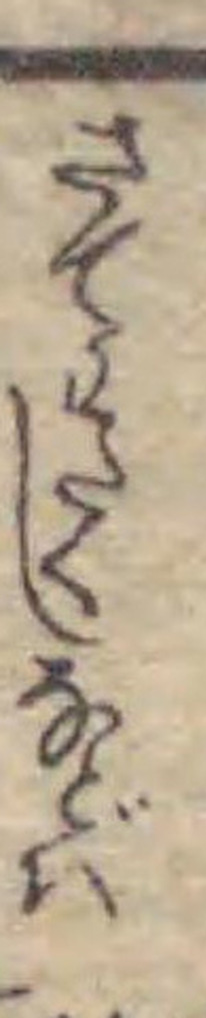さてわたくしなどは
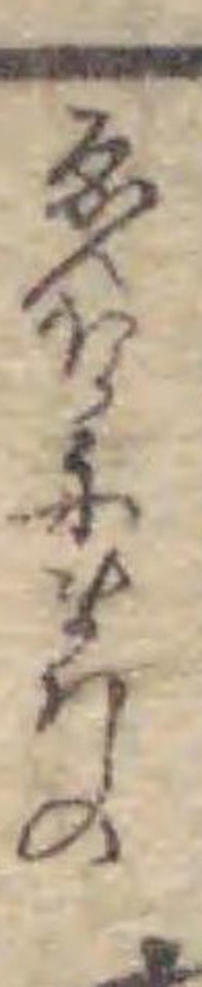ゑんほう舟まはしの
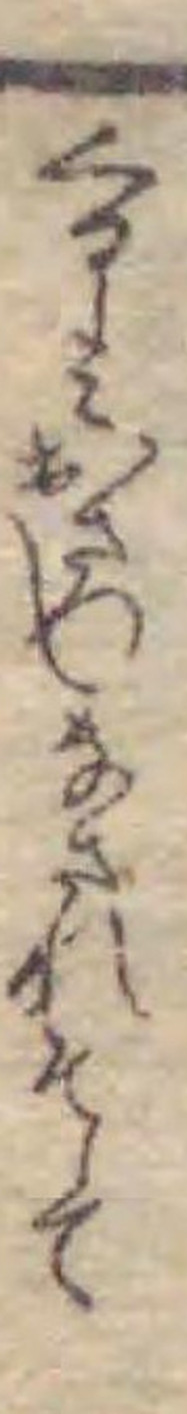くるしみおさつしなされそして
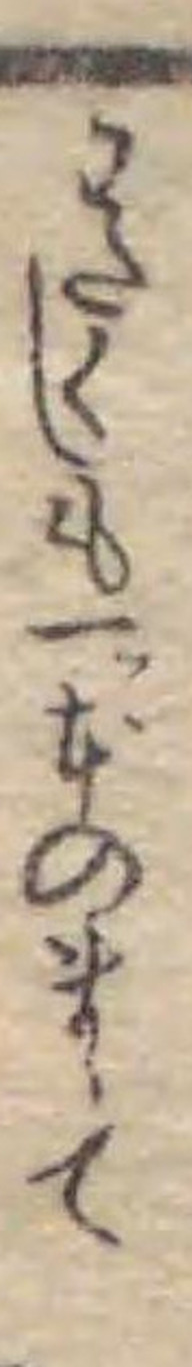わたくしも一ツ本のまゝて
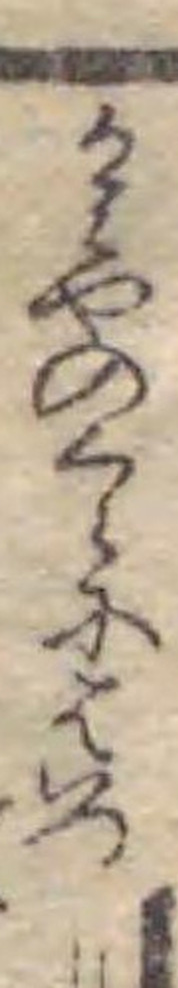かみやのくらにはいつて
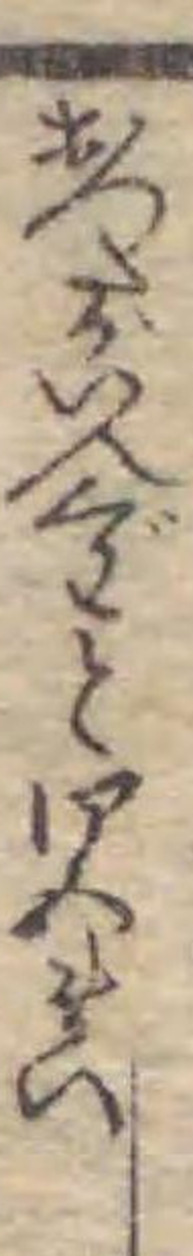おつたらいんぐわと四五まい
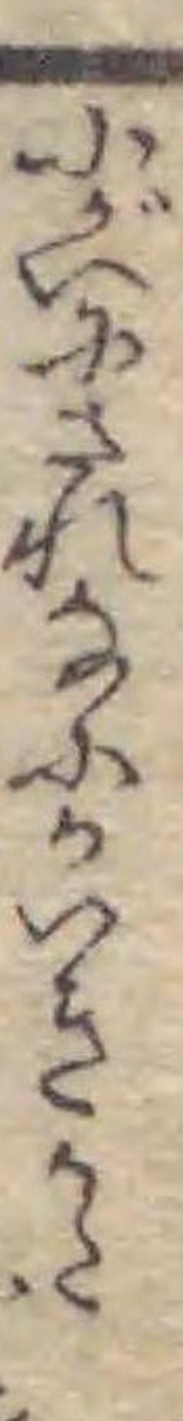小がいにされなにかいきかた
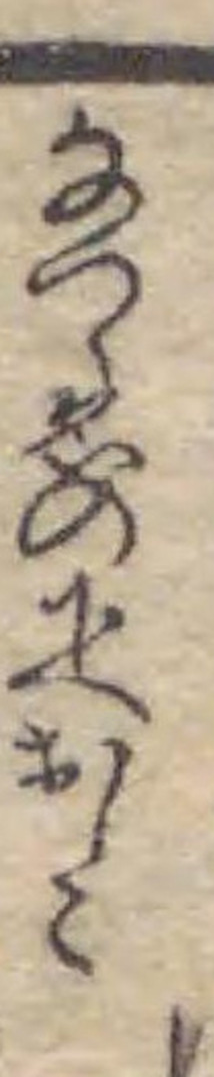なつくゑの下へおしこ
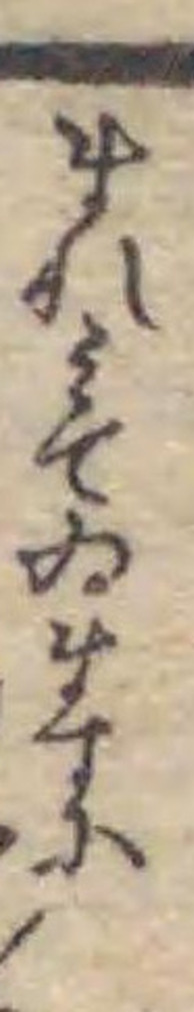まれみてゐますに
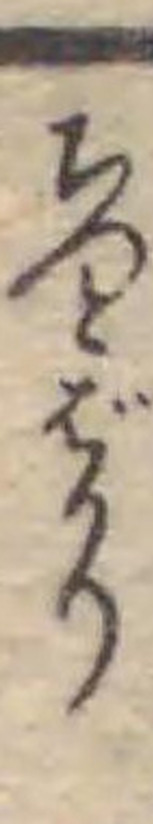ちつとばかり
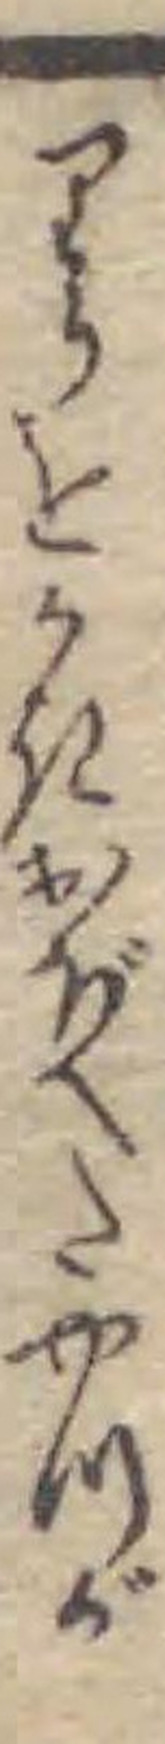りうをかきおぼへたやつが
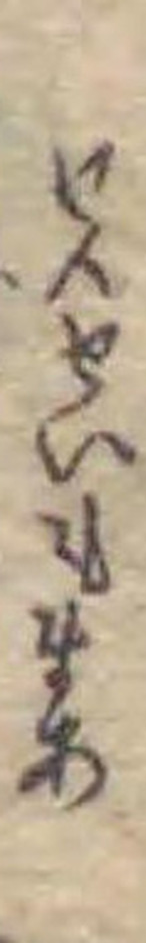せんせいもまあ
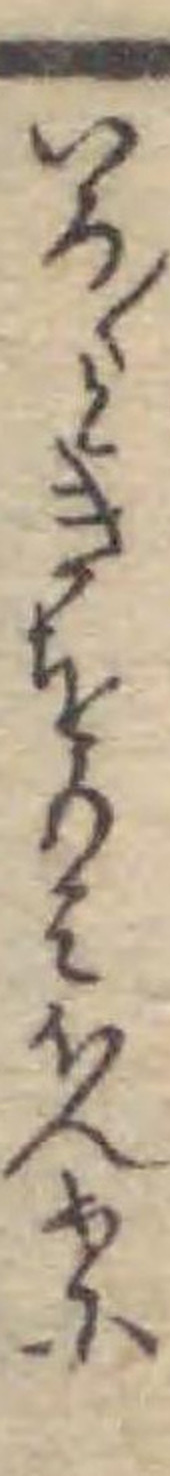いろ〳〵ときをもみほんきに
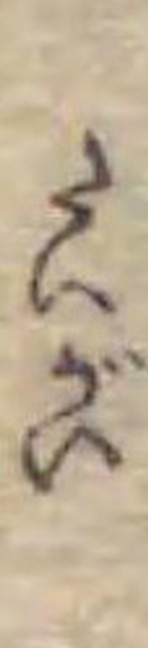たいがい
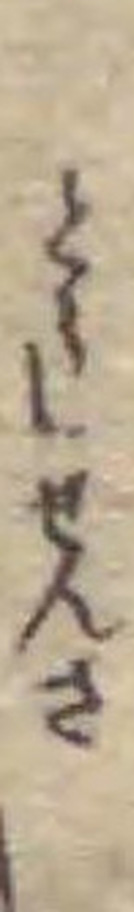とうしせんさ
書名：紙屑身上噺 : 3巻
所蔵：国立国会図書館 National Diet Library, JAPAN
